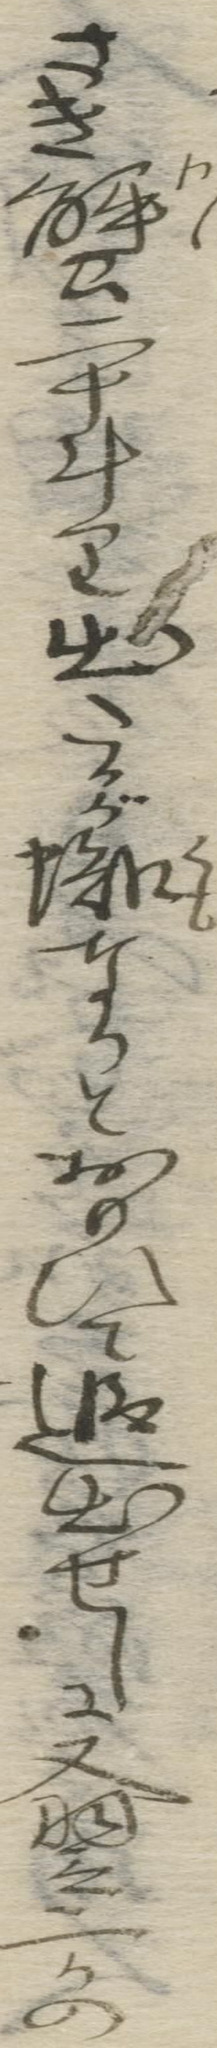さき蟹二十斗り出たるが蜘なりとおもひて追出せしに又翌二日の
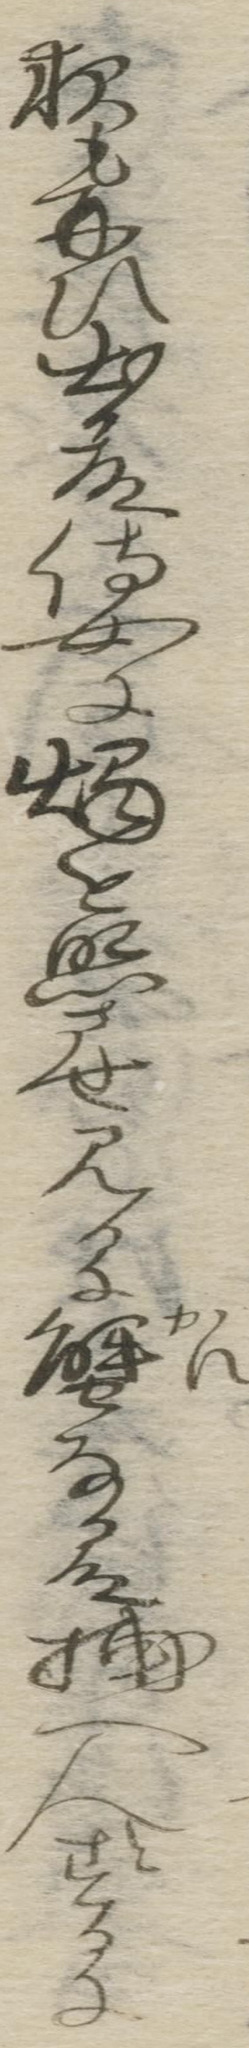夜も再ひ出る故侍女に燭を照させ見るに蟹なる故捕へんとするに
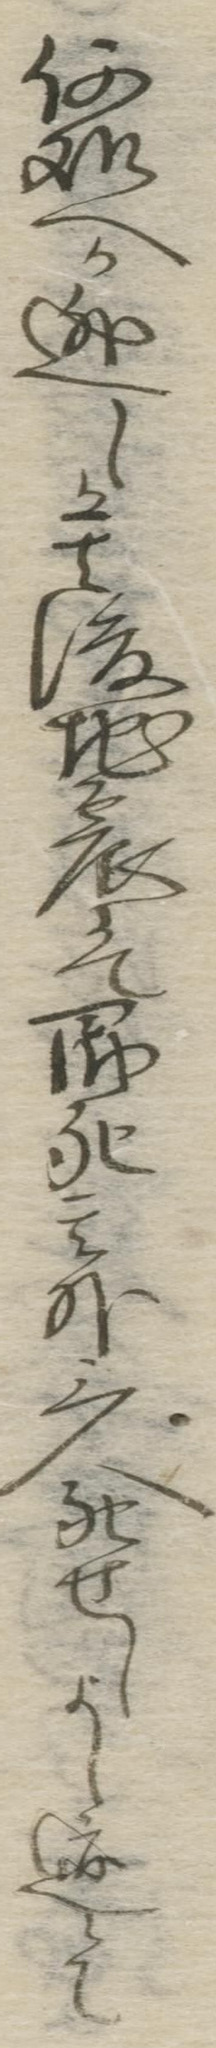何処へか逃しか其後地震にて即死其外三人死せしよし迹にて
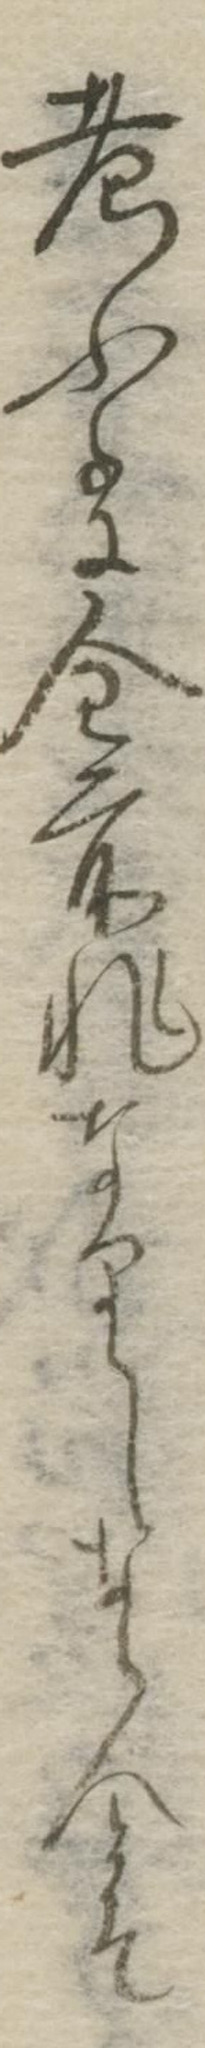考ふるに全前兆なりしならんとそ
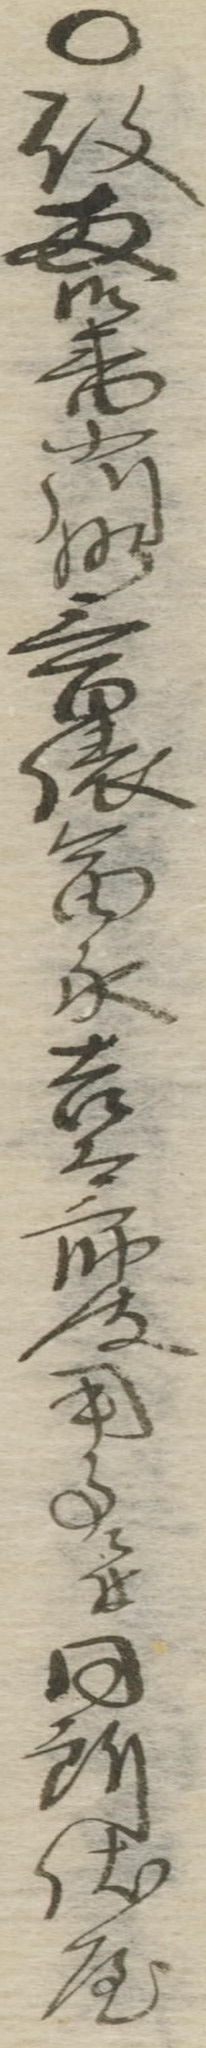○役両御番小川町三百俵富永吉太郎殿用事ニ付同所伏屋
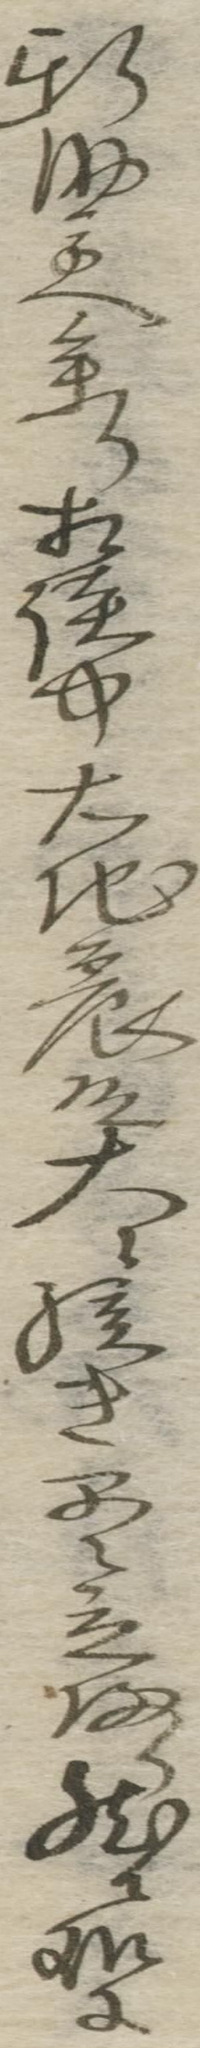新助方へ参り相談中右地震故大に駭き早々立帰り然る処に
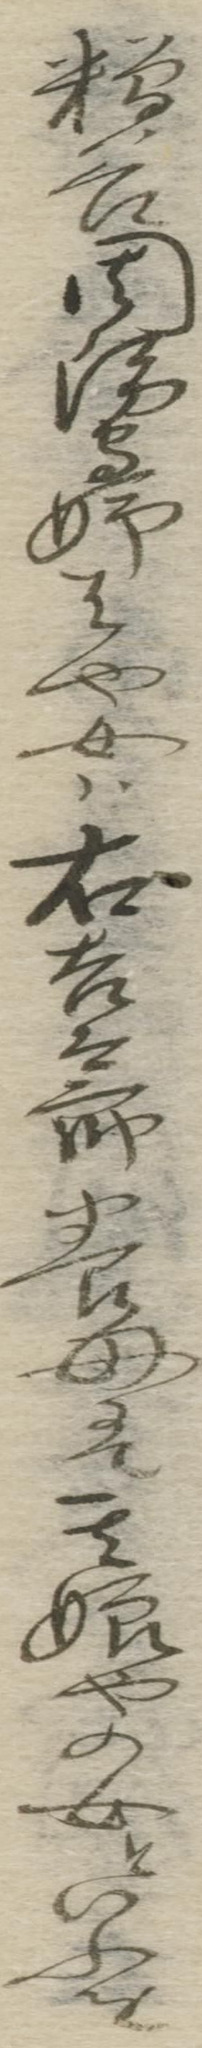糟谷因幡守姉はや女ハ右吉太郎養母にて其娘やの女といふを

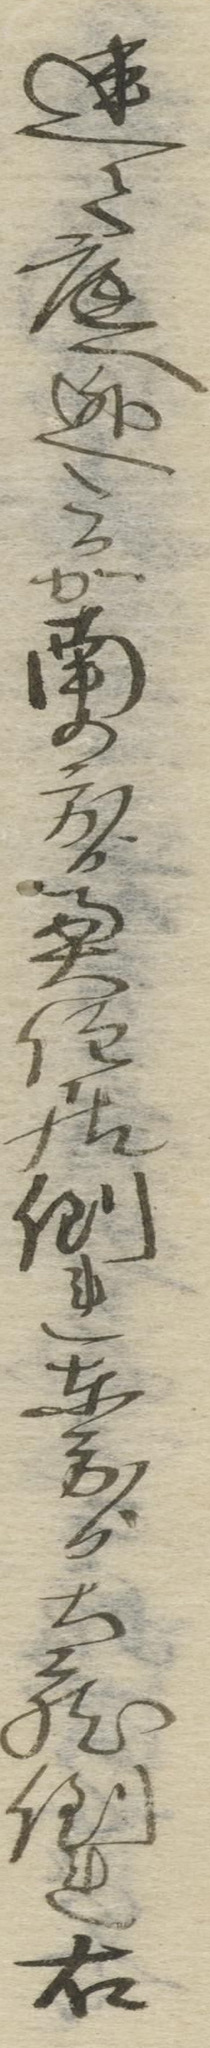連て庭へ逃たるが南の方ゟ奥住居倒れ東方ゟ土蔵倒れ右
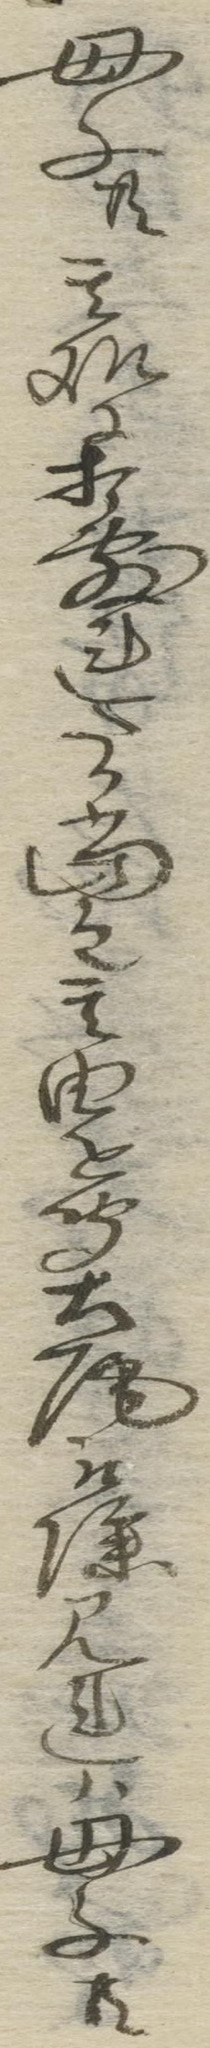母子共其処に打敷れたり当主其由を聞土瓦取除見れハ母子共
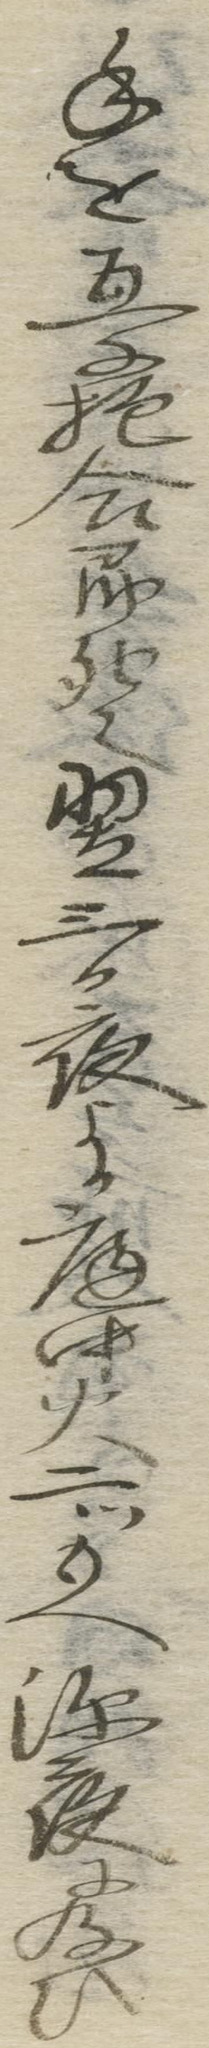手を互に抱合即死也翌三日夜より庭中火二ツもへ深夜に及ひ
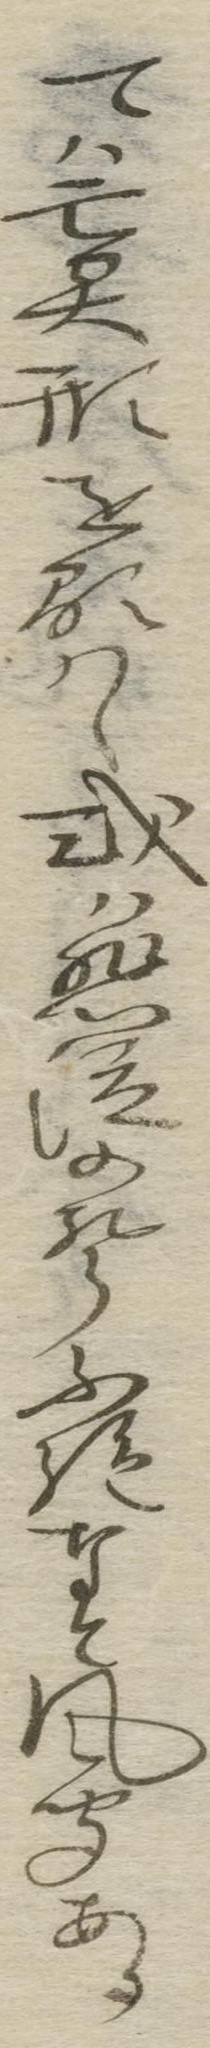ては亡霊形を顕ハし或は悲泣の声不絶えなと風聞あり
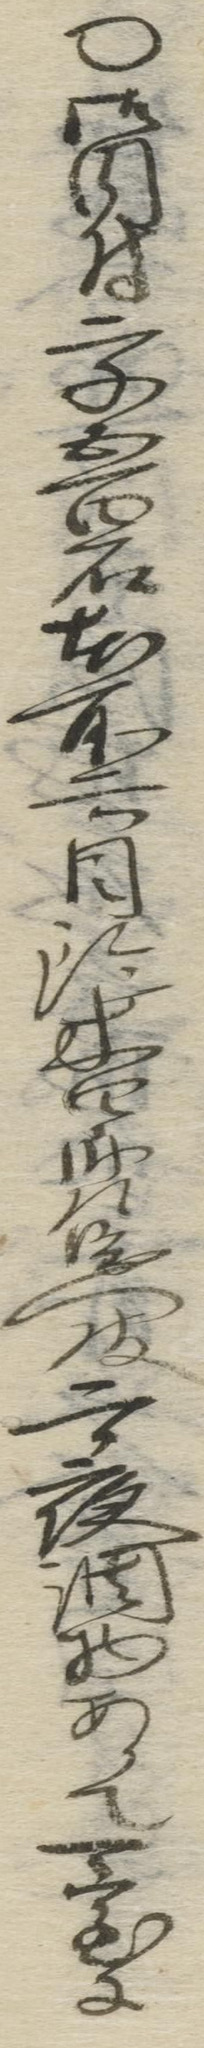○御用付二千五百石本所二ツ目鈴木四郎左衛門殿二日夜調物ありて一室に
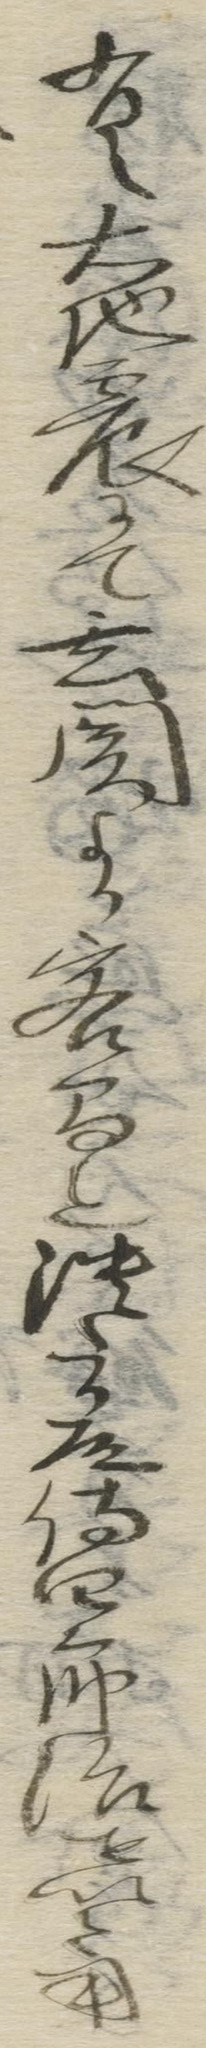有之大地震にて玄関より客間迄潰たる故侍四郎治を以て用
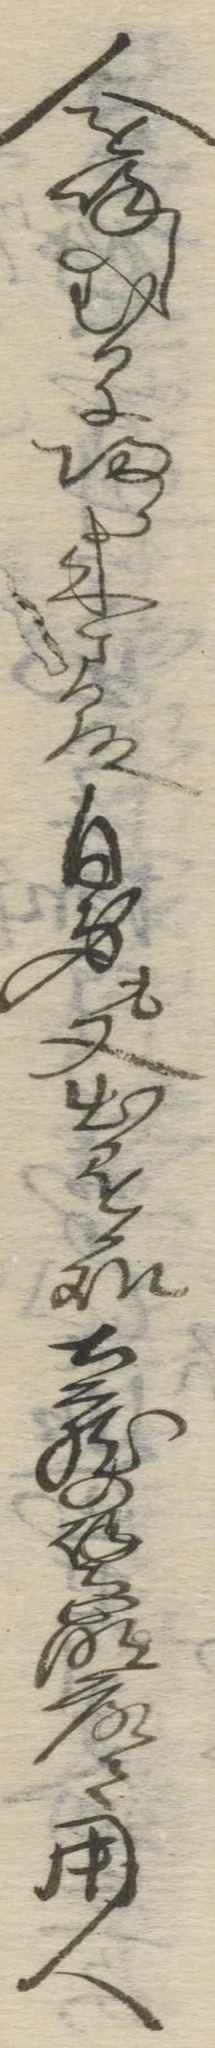人を呼しむるに帰り来さる故自身も又出懸候処土蔵の壁崩落て用人
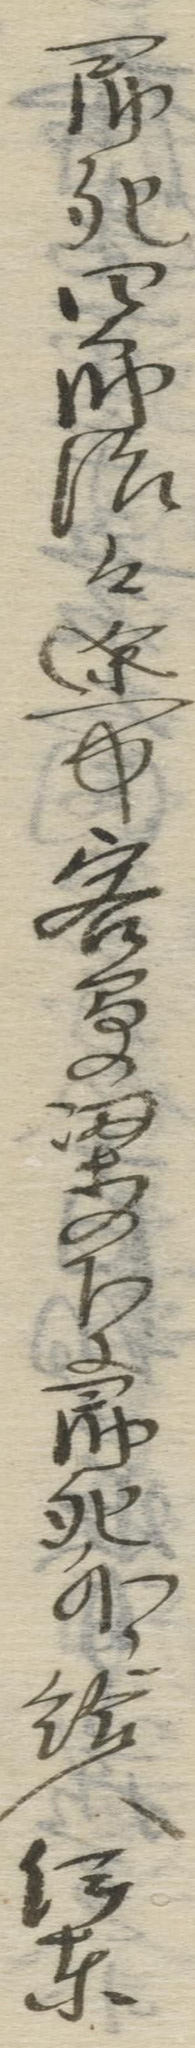即死四郎治は途中客間の梁の下に即死外に給人伊東
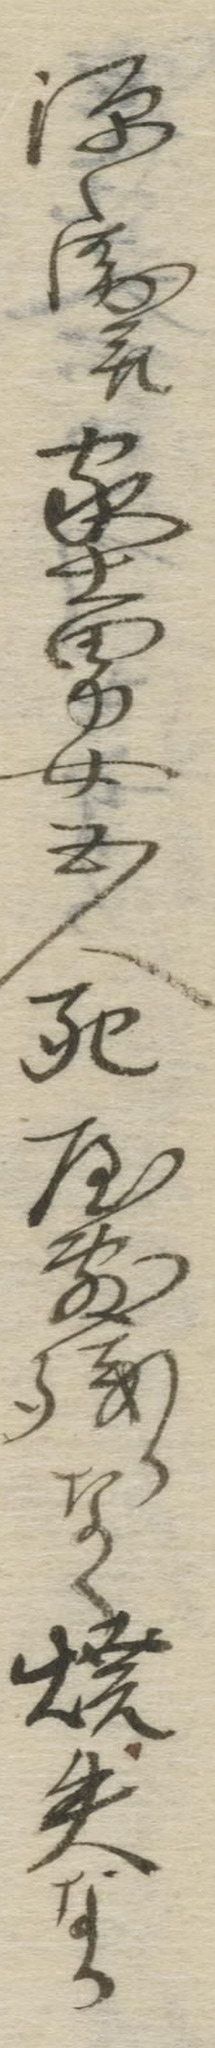源兵衛并家士男女五人死屋敷残りなく焼失なり
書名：江戸中諸屋敷　地震竒談録
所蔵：東京大学地震研究所図書室 Earthquake Research Institute Library, The University of Tokyo, JAPAN
